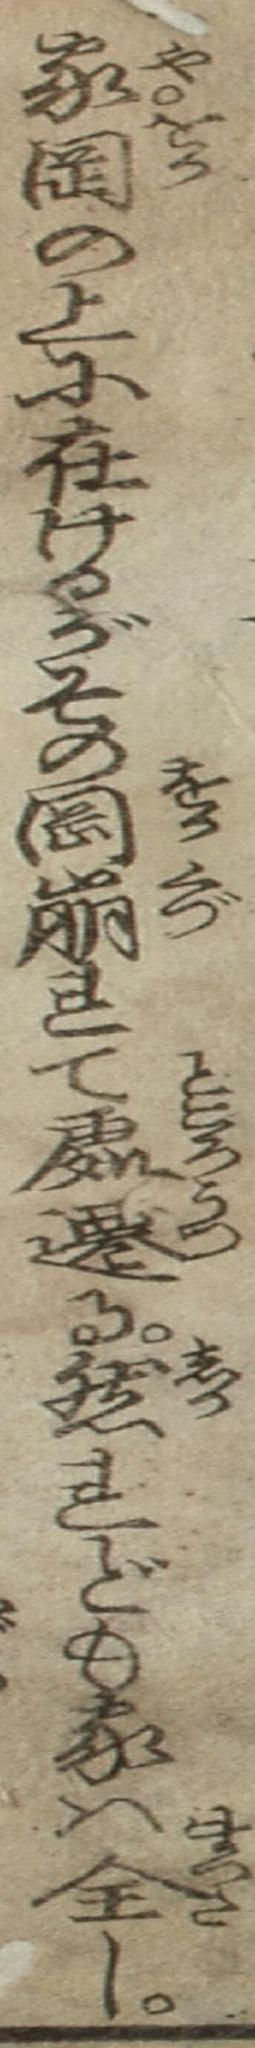家。岡の上に在けるがその岡崩れて処遷る。然れども家は全し。
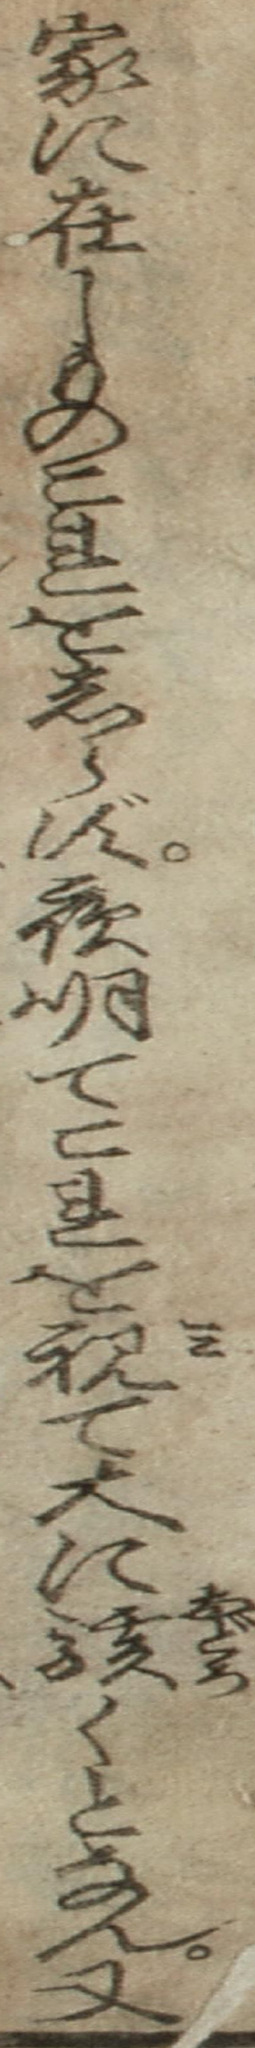家に在しものこれをしらず。夜明てこれを視て大に駭くとなん。又
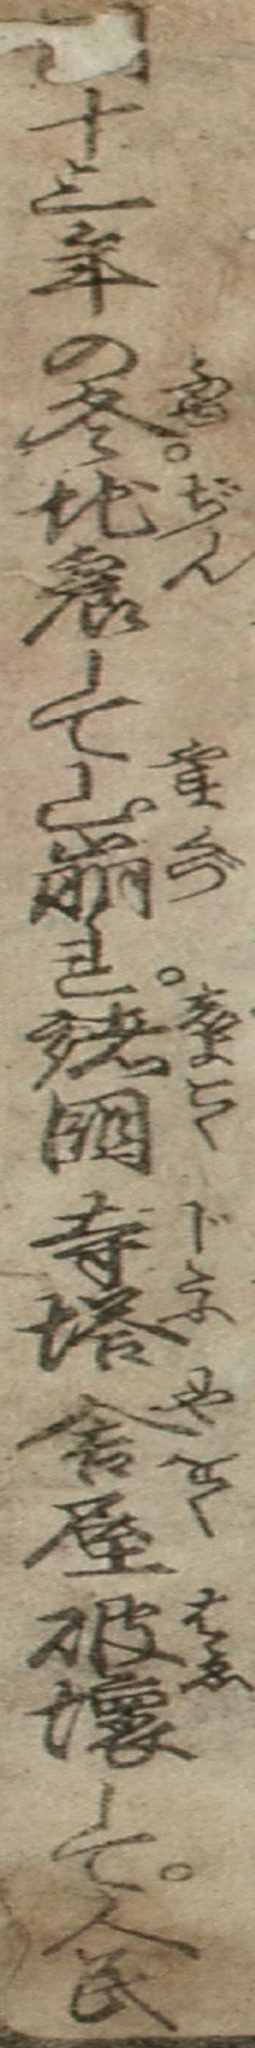同？十三年の冬。地震して山崩れ。諸国寺塔舎屋破壊して。人民

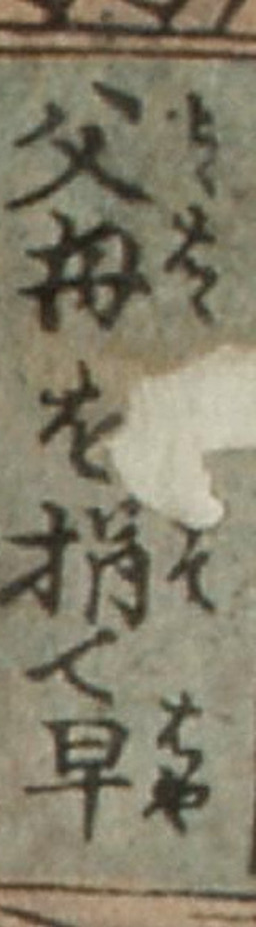父母を捐て早
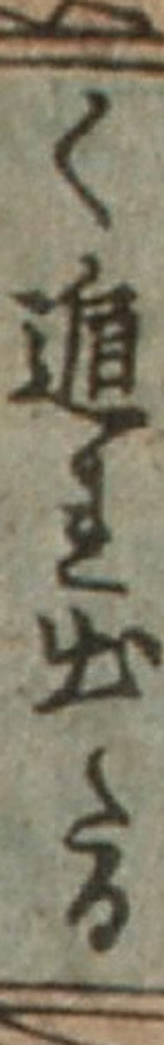く遁れ出たる
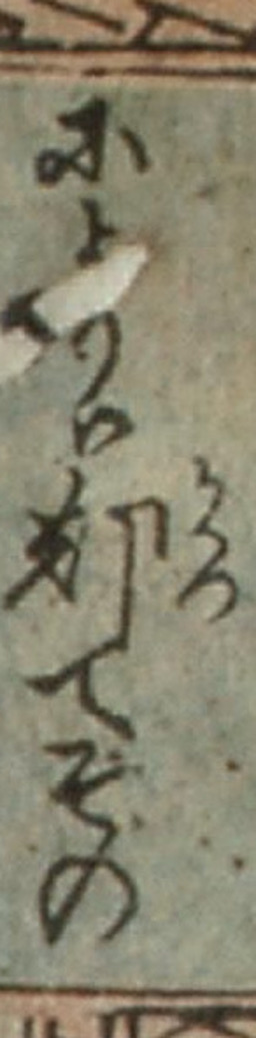によりて却てその
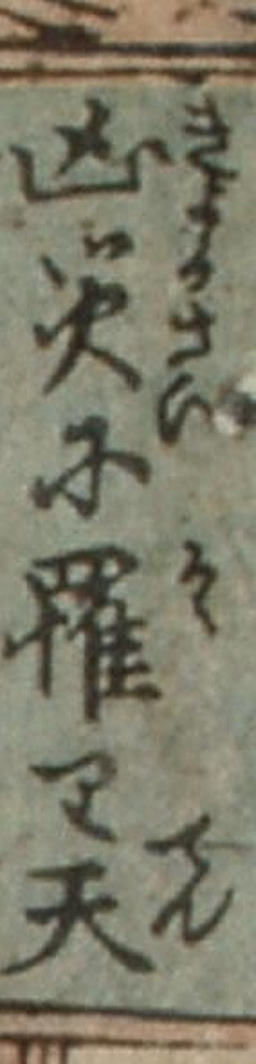凶災に罹り天
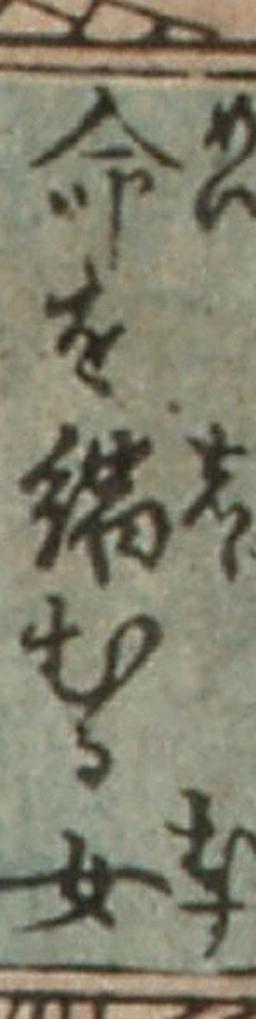命を縮むる女
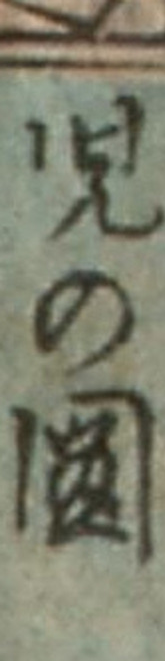児の図

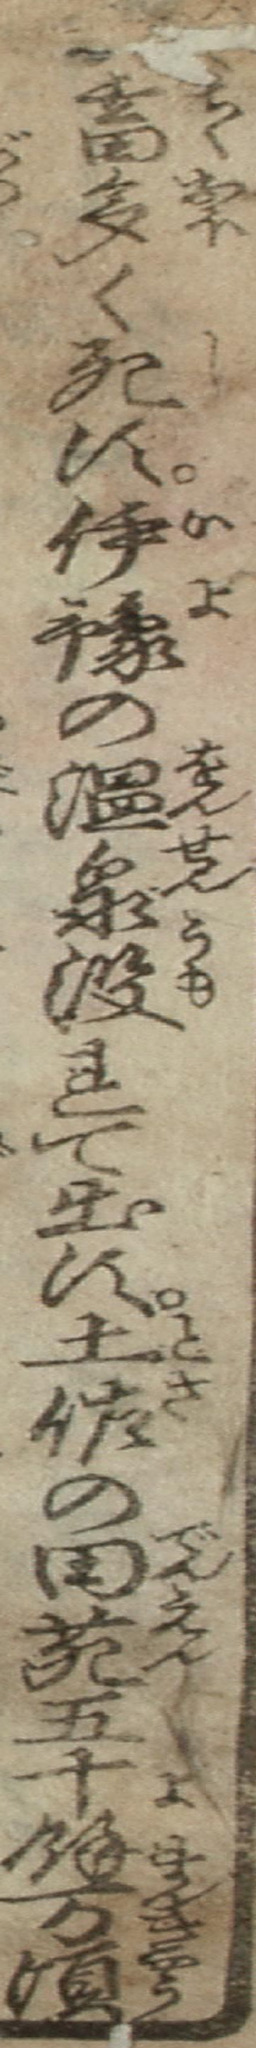六畜多く死す。伊予の温泉没れて出す。土佐の田苑五十餘万頃
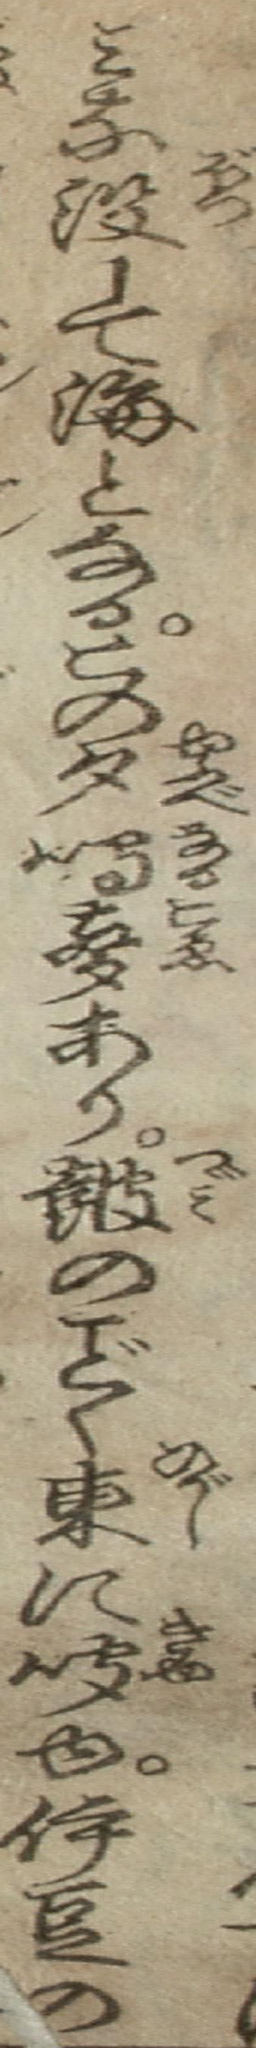みな没して海となる。この夕鳴声あり。皷のごとく東に聞ゆ。伊豆の
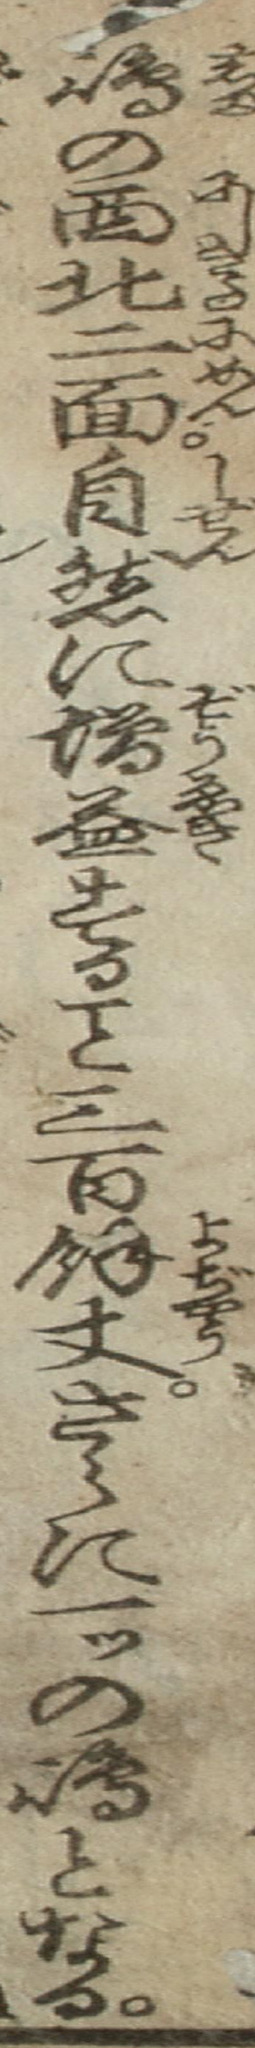嶋の西北二面。自然に増益すること三百餘丈。さらに一ッの嶋となる。
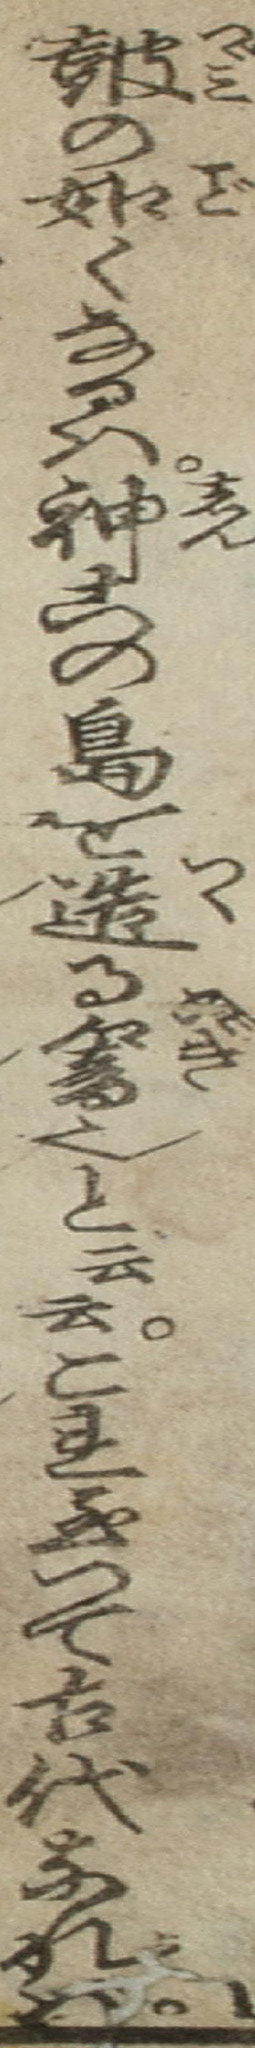皷の如くなるは。神この島を造る響なりと云云。これ至つて古代なれば。
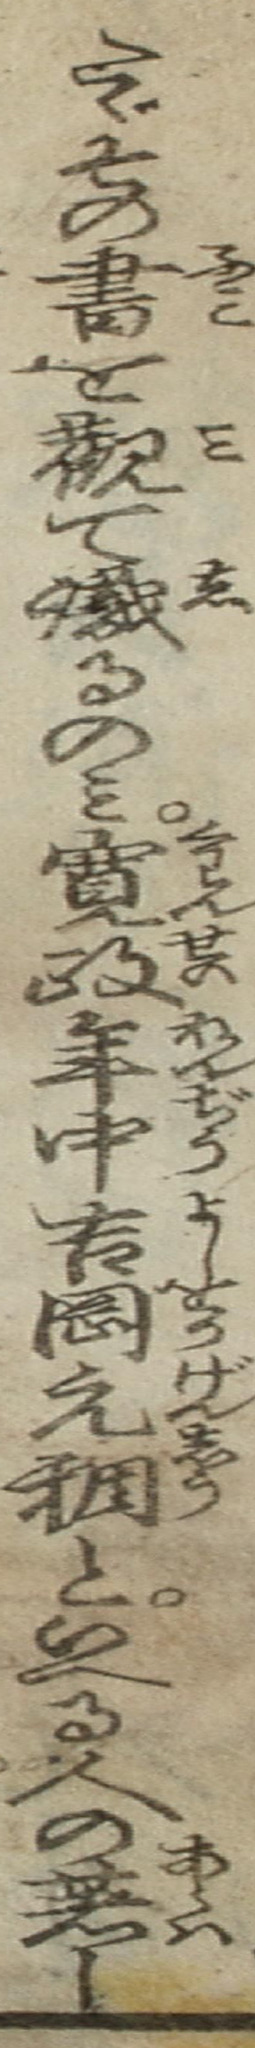たゞその書を観て識るのみ。寛政年中吉岡元稠と。いへる人の著し
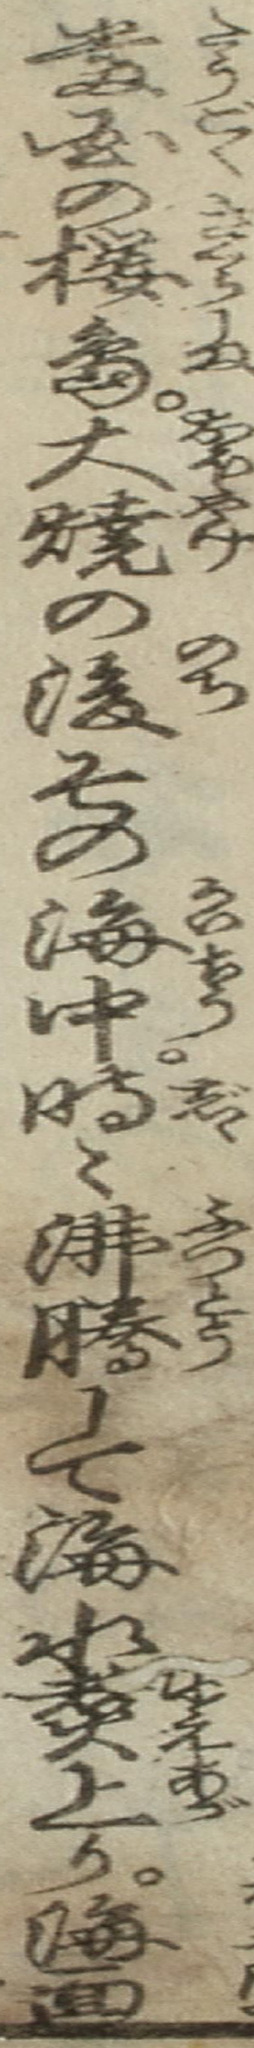当国の桜島。大焼の後その海中。時〻沸騰して海水煮上り。海面
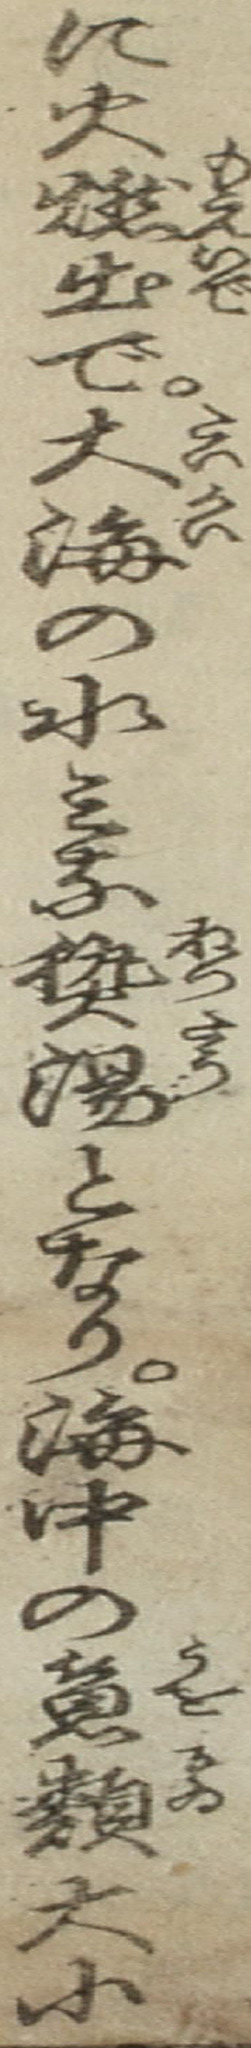に火燃出で。大海の水みな熱湯となり。海中の魚類大小
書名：安政見聞録　中
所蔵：東京大学地震研究所図書室 Earthquake Research Institute Library, The University of Tokyo, JAPAN
